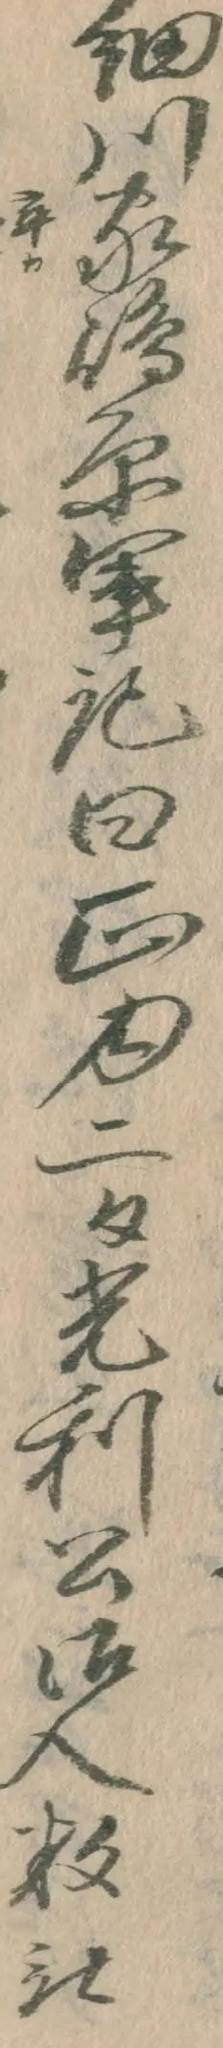細川家島原軍記曰正月二日光利公御人数被
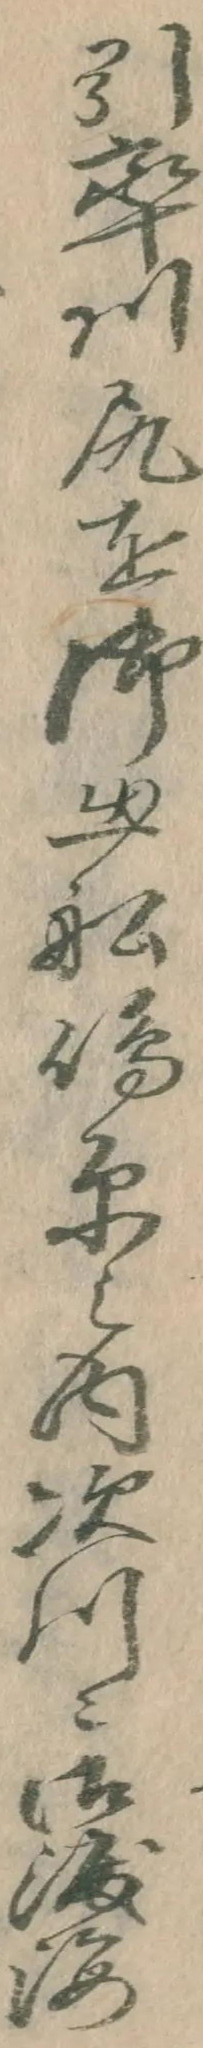引卒川尻を御出舩島原之内次川に御渡海
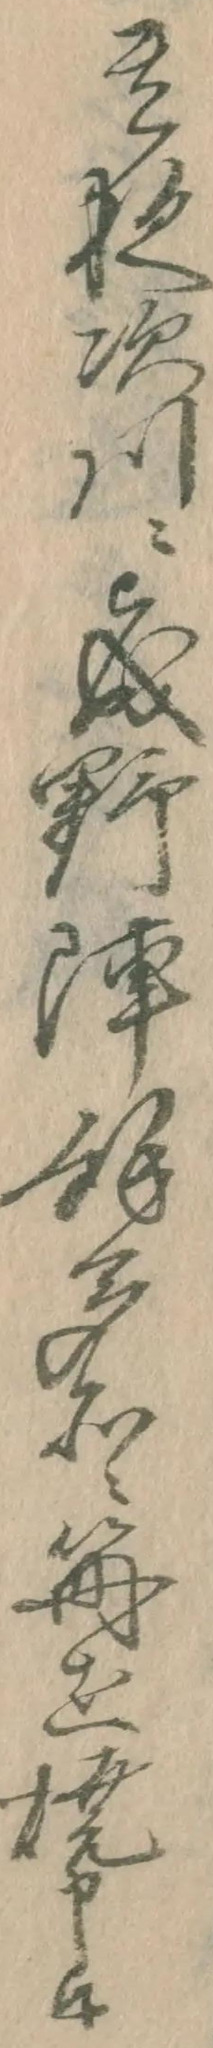其夜次川に被成野陣余多所に篝を焼申候

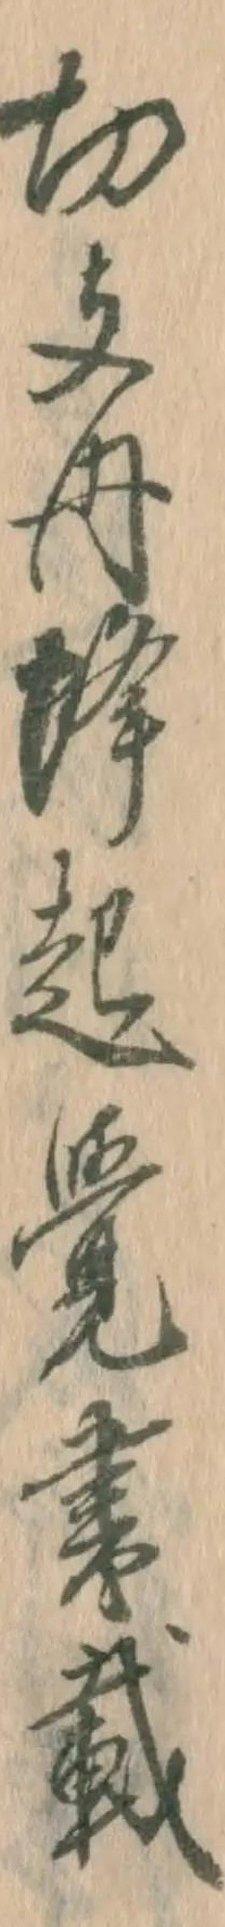切支丹蜂起覚書載
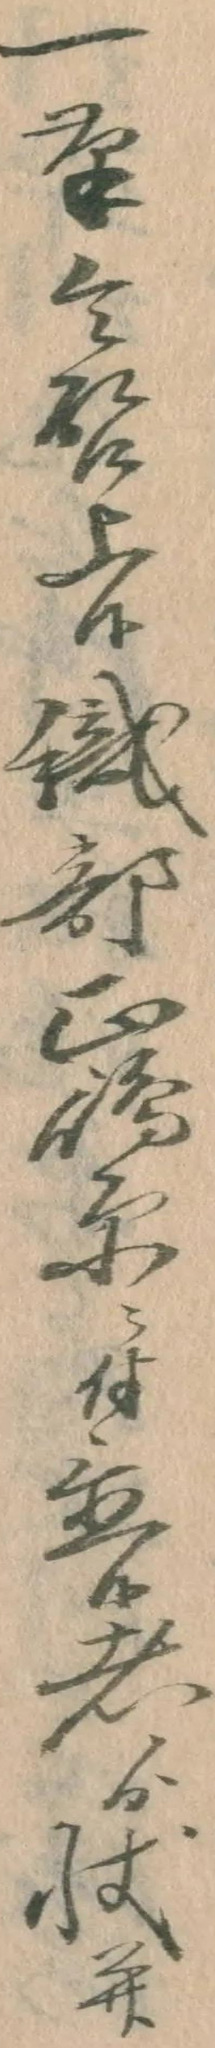一筆今啓上候織部正島原に付置候者ゟ状幷
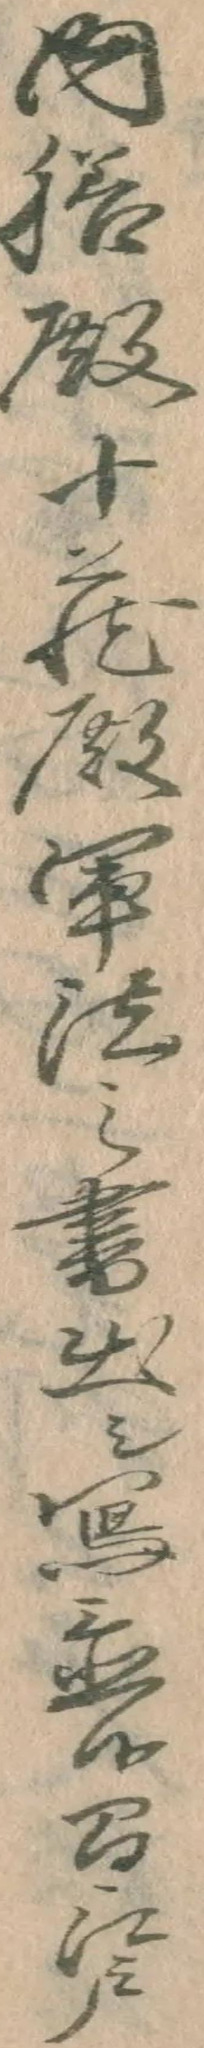内膳殿十蔵殿軍法之書出し写置候間江戸
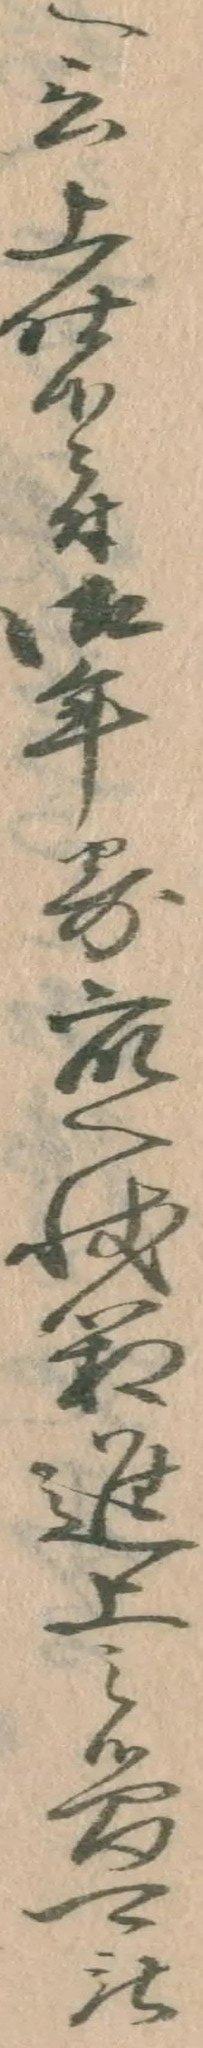へ言上付候に付御年寄衆へ状箱進上之候間可被
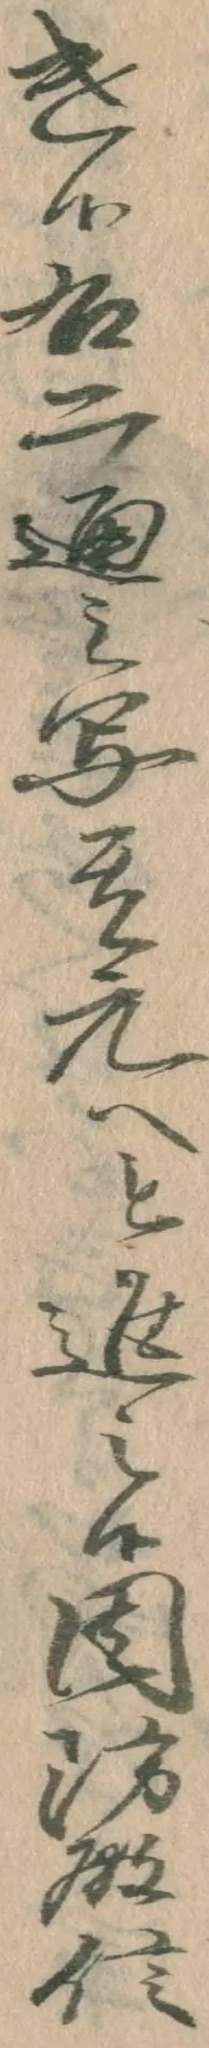遣候右二通之写其元へと進之候周防殿信
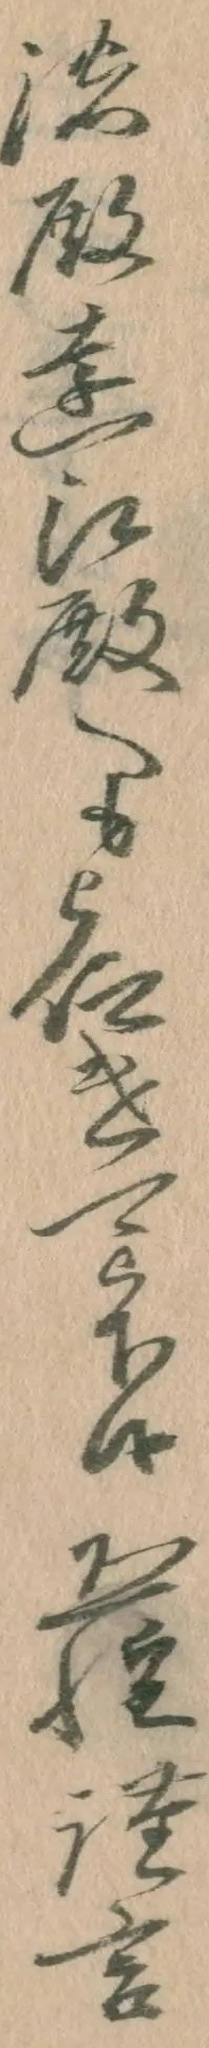濃殿遠江殿へも被仰遣可被下候恐惶謹言
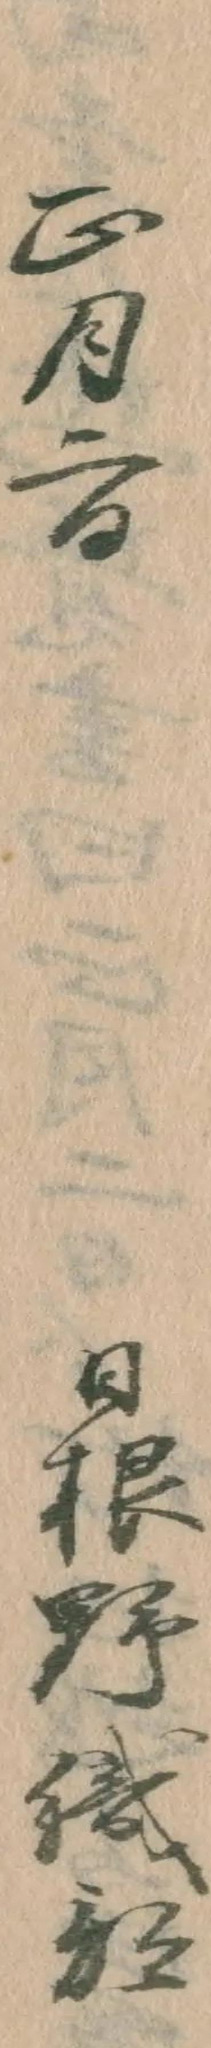正月二日日根野織部
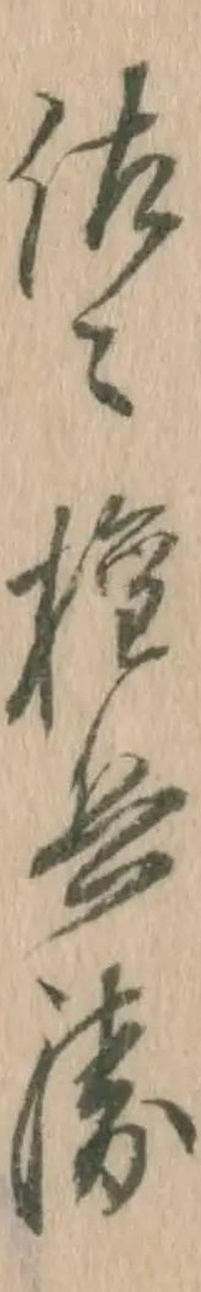佐々権兵衛
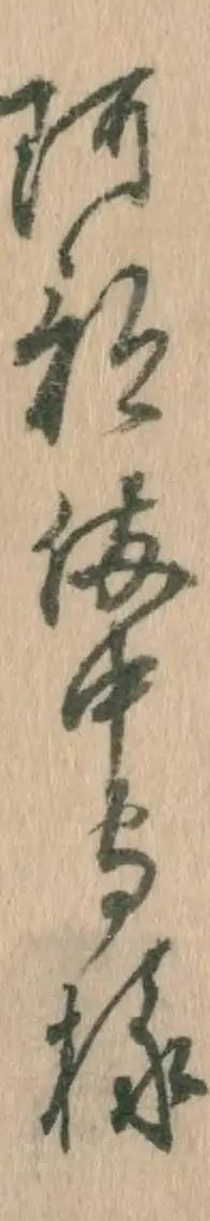阿部備中守様
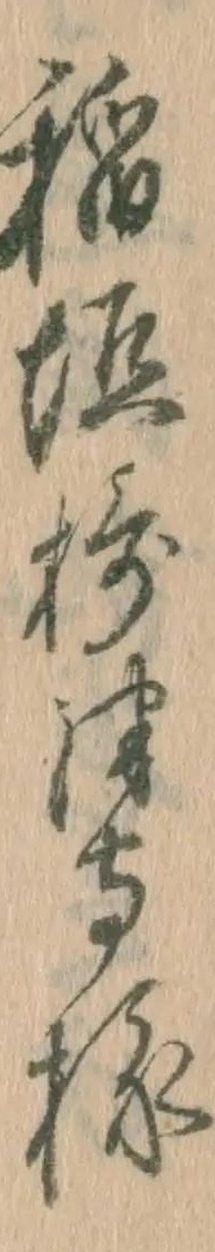稲垣摂津守様
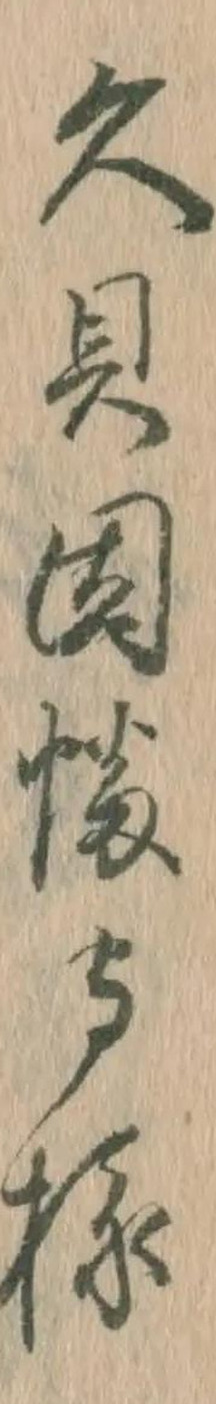久貝因幡守様
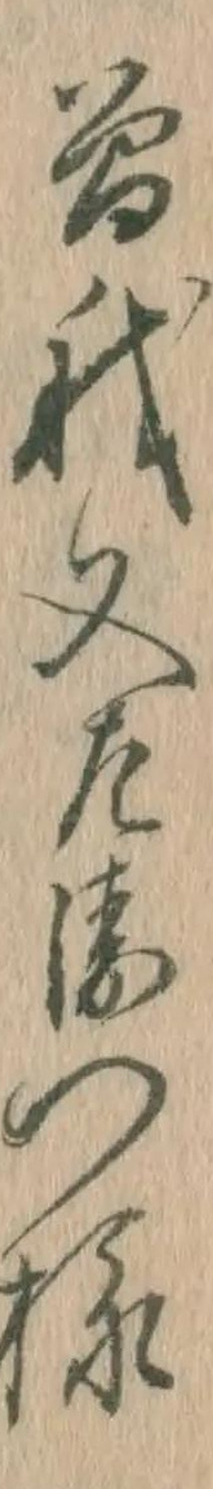曽我又左衛門様
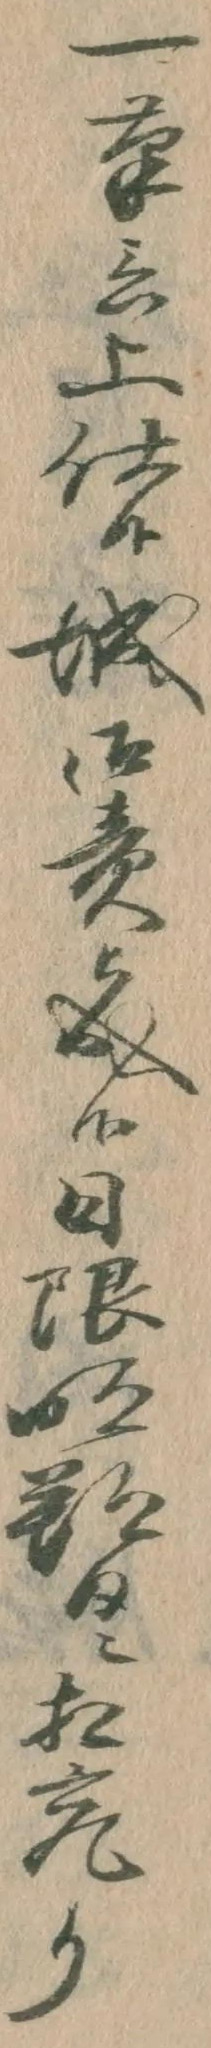一筆言上仕候城御責被成候日限明朔日に相究り
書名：切支丹御退治記 49巻. [5]
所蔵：国立国会図書館 National Diet Library, JAPAN
